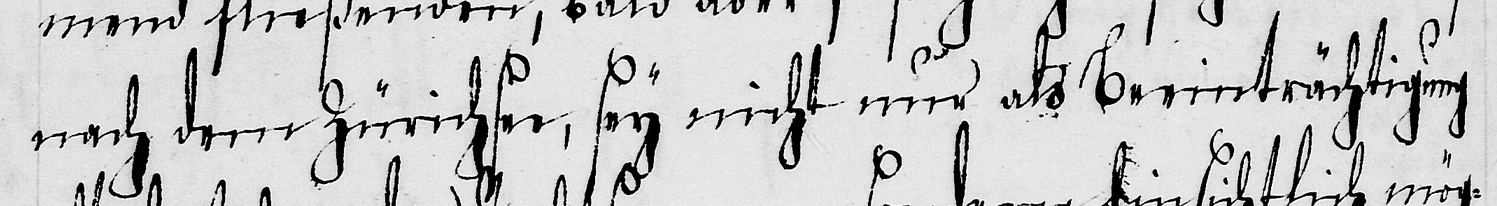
nach dem Zürichsee, sey nicht nur als Beeinträchtigung
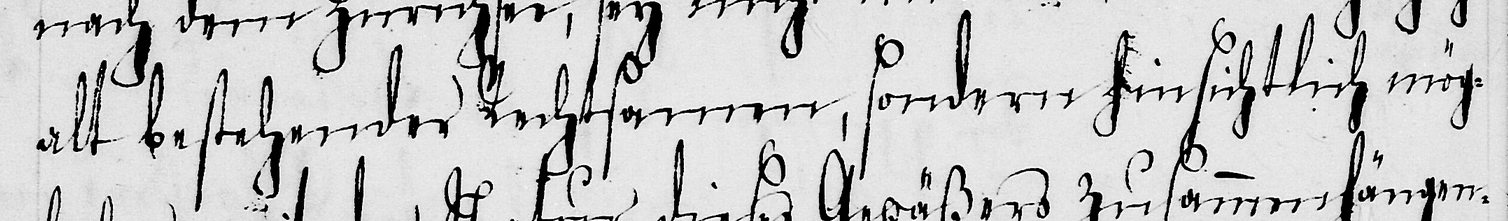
alt bestehender Rechtsamen, sondern hinsichtlich mög¬
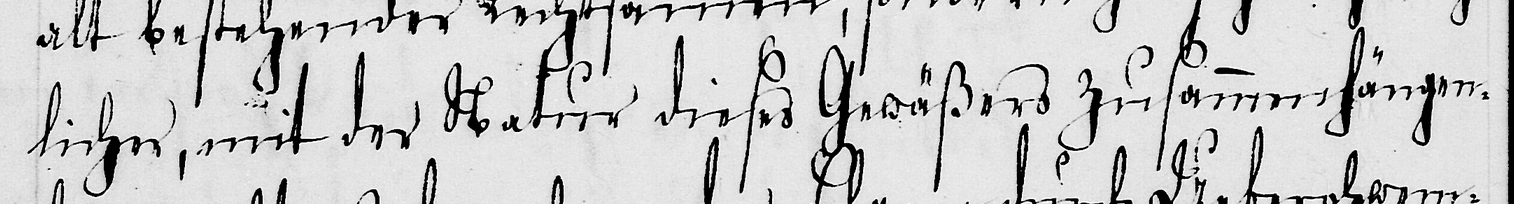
licher, mit der Natur dieses Gewäßers zusammen hängen¬
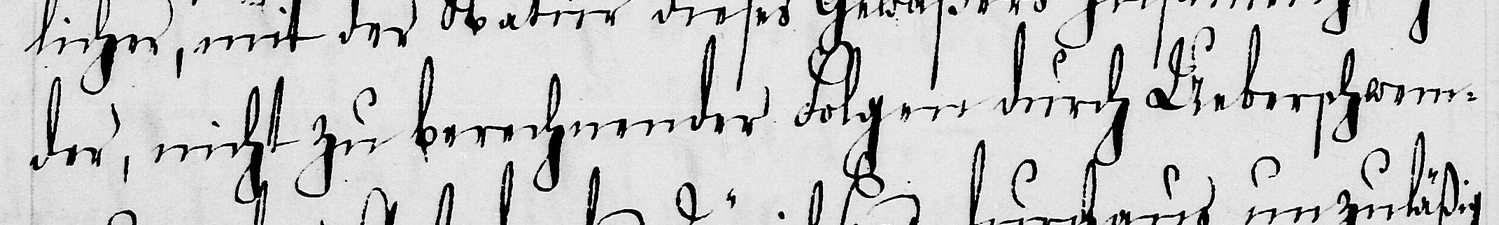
der, nicht zu berechnender Folgen durch Ueberschwem¬
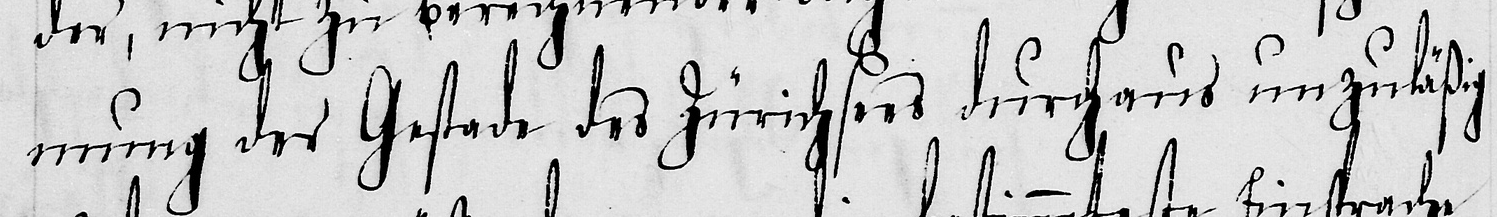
mung der Gestade des Zürichsees durchaus unzuläßig
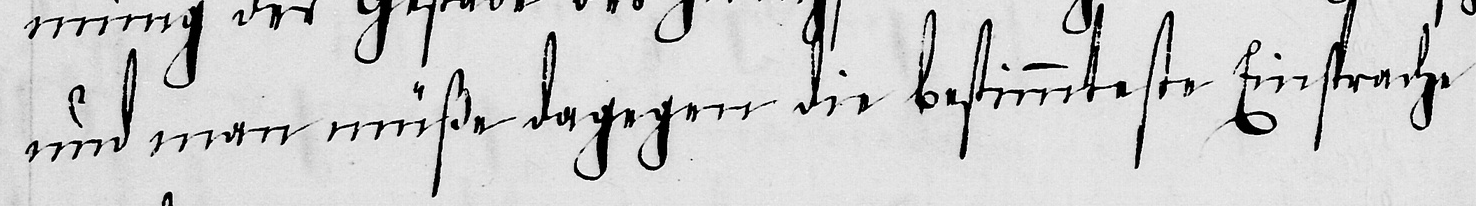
und man müße dagegen die bestimmteste Einsprache
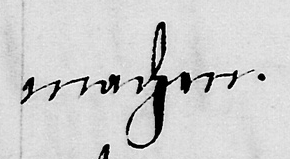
machen.
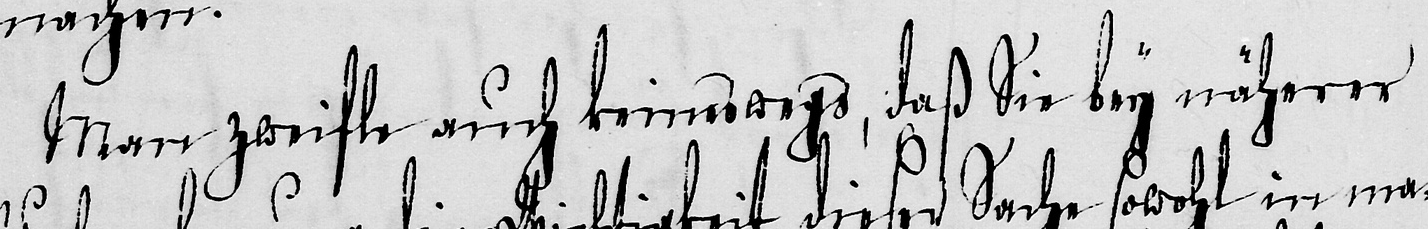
Man zweifle auch keineswegs, daß Sie bey näherer
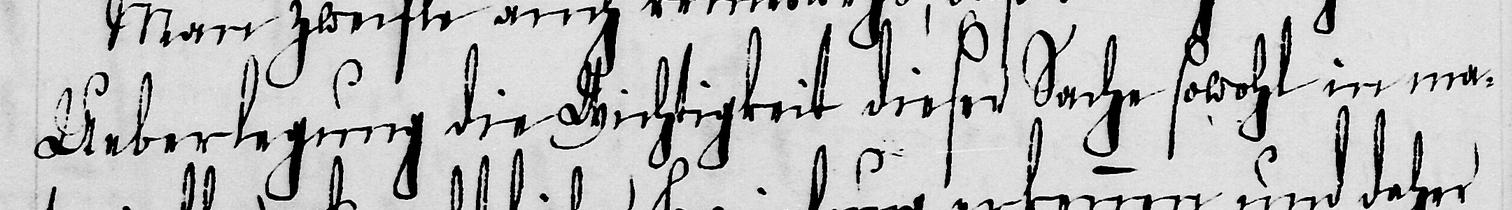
Ueberlegung die Wichtigkeit dieser Sache sowohl in ma¬
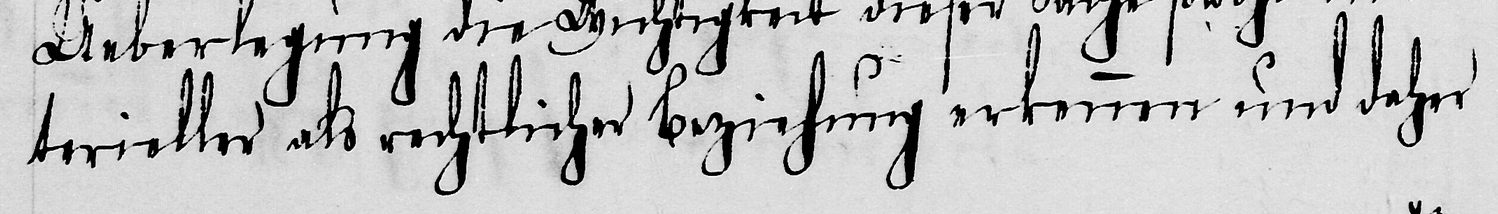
terieller als rechtlicher Beziehung erkennen und daher
